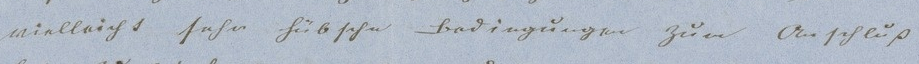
vielleicht sehr hübsche Bedingungen zum Anschluß
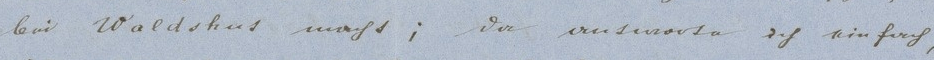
bei Waldshut macht; da antworte ich einfach,
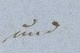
und
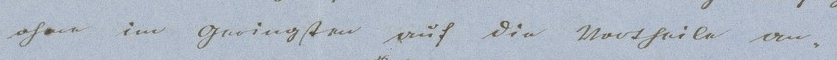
ohne im Geringsten auf die Vortheile an-
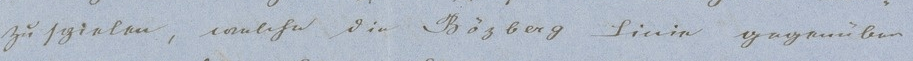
zuspielen, welche die Bözberg Linie gegenüber
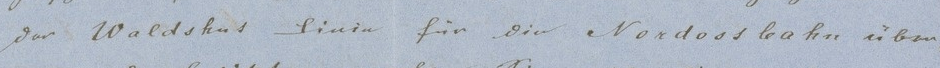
der Waldshut Linie für die Nordostbahn über-
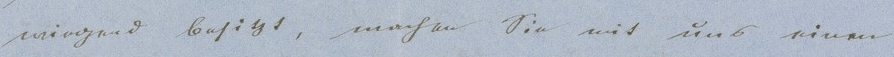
wiegend besitzt, machen Sie mit uns einen
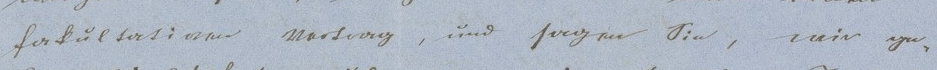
fakultativen Vertrag, und sagen Sie, wir ge-
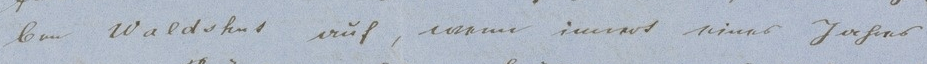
ben Waldshut auf, wenn innert eines Jahres
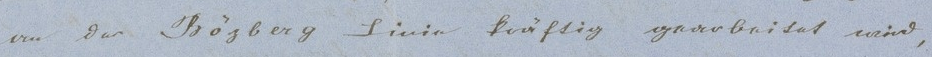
an der Bözberg Linie kräftig gearbeitet wird,
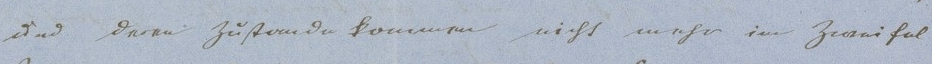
und deren Zustande kommen nicht mehr im Zweifel
